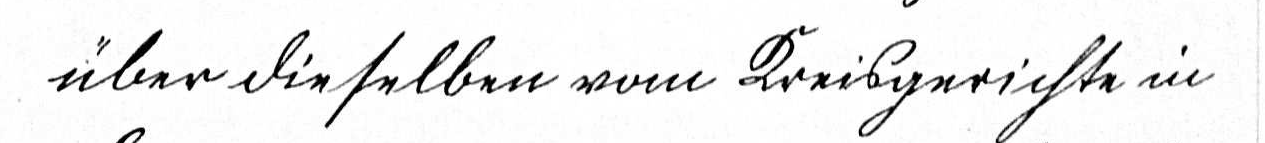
über dieselben vom Kreisgerichte in
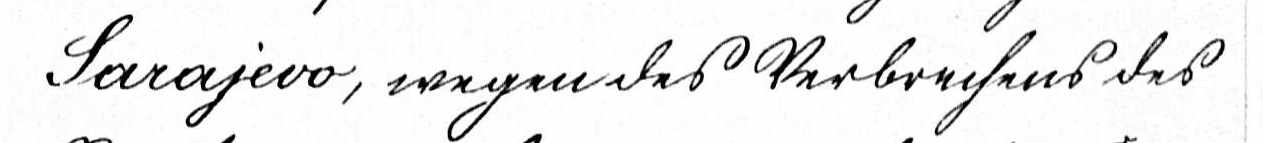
Sarajevo, wegen des Verbrechens des
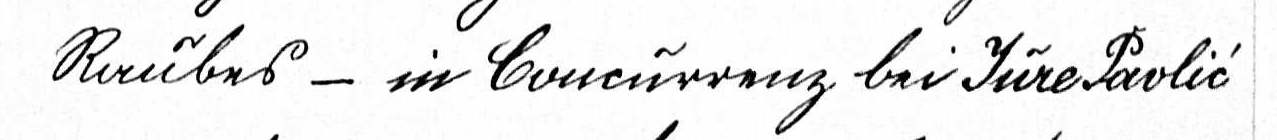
Raubes -- in Concurrenz bei Jure Pavlić
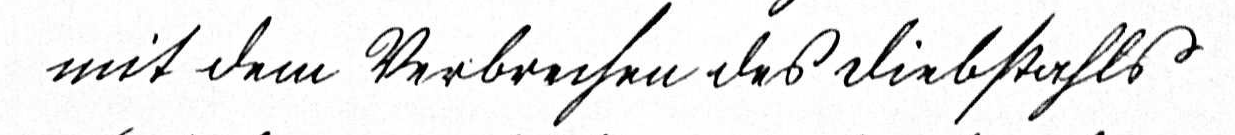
mit dem Verbrechen des Diebstahles
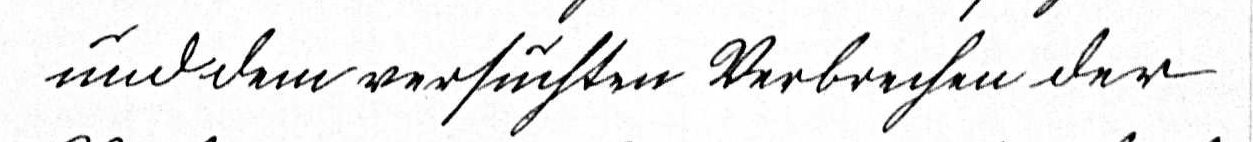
und dem versuchten Verbrechen der
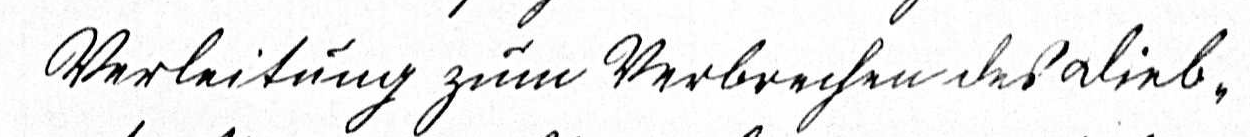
Verleitung zum Verbrechen des Dieb¬
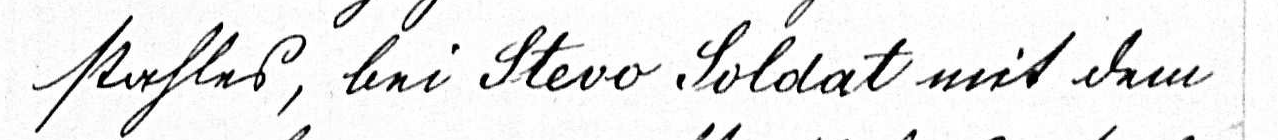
stahles, bei Stevo Soldat mit dem
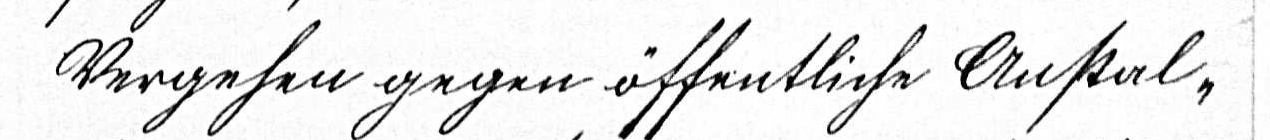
Vergehen gegen öffentliche Anstal¬
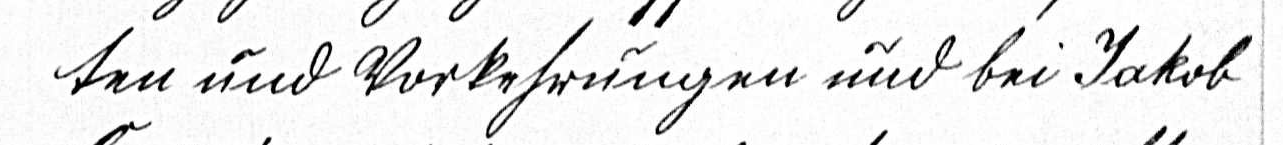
ten und Vorkehrungen und bei Jakob
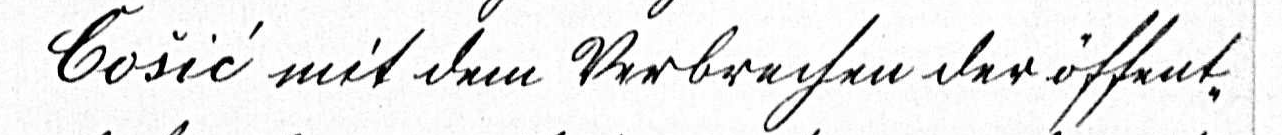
Čošić mit dem Verbrechen der öffent¬
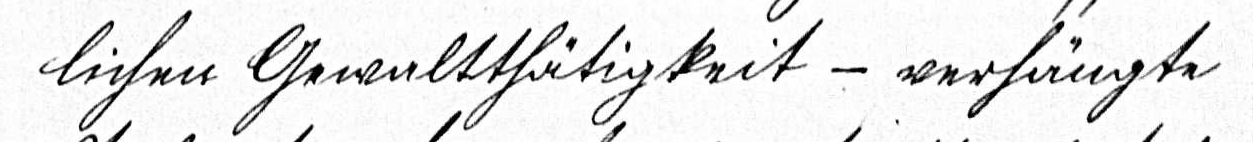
lichen Gewaltthätigkeit – verhängte
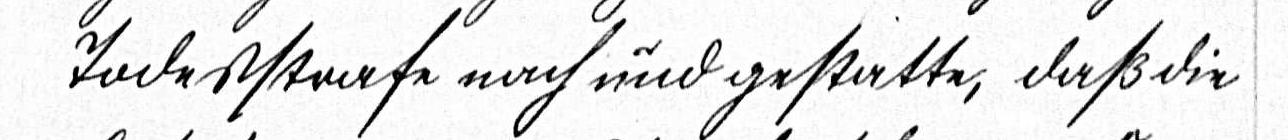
Todesstrafe nach und gestatte, daß die
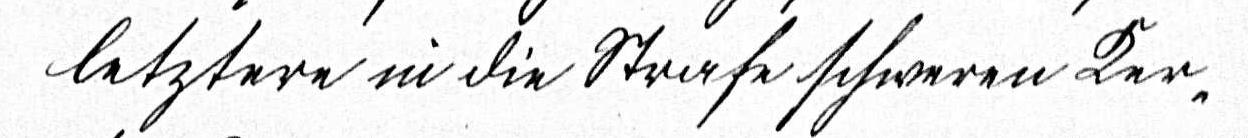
letztere in die Strafe schweren Ker¬
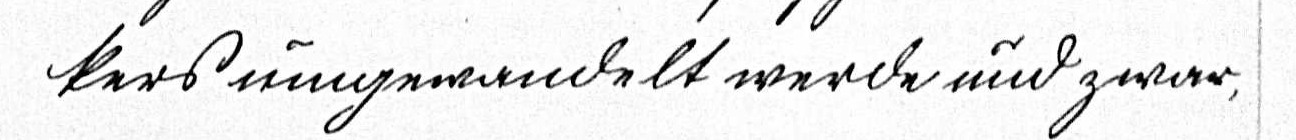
kers umgewandelt werde und zwar
